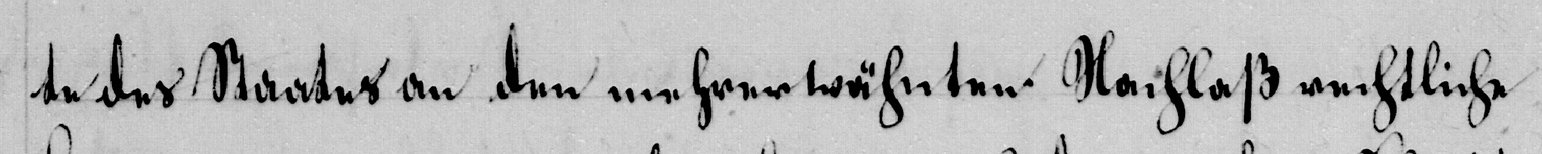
te des Staates an den mehrerwähnten Nachlaß rechtliche
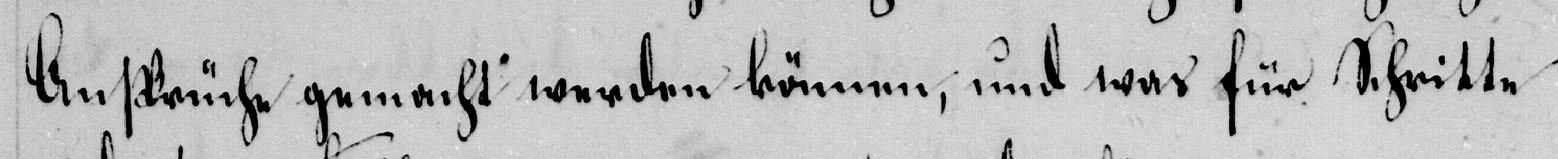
Ansprüche gemacht werden können, und was für Schritte
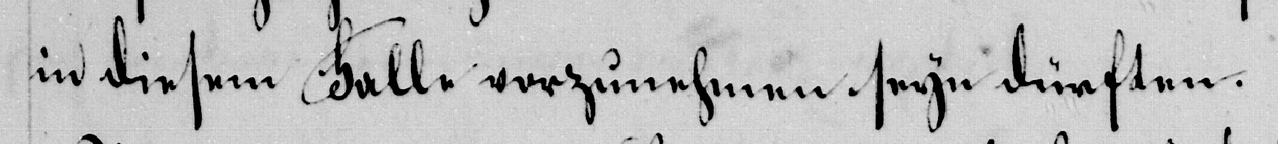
in diesem Falle vorzunehmen seyn dürften.
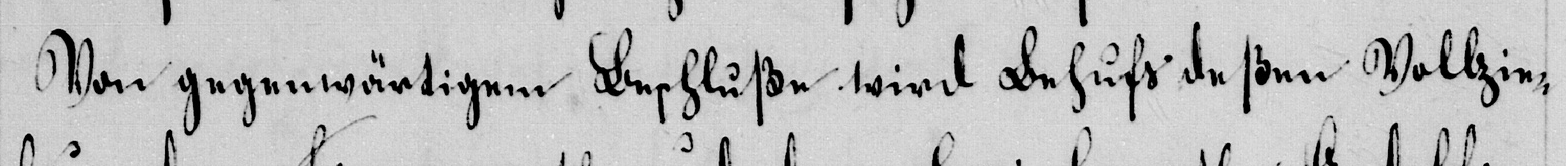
Von gegenwärtigem Beschluße wird Behufs deßen Vollzie¬
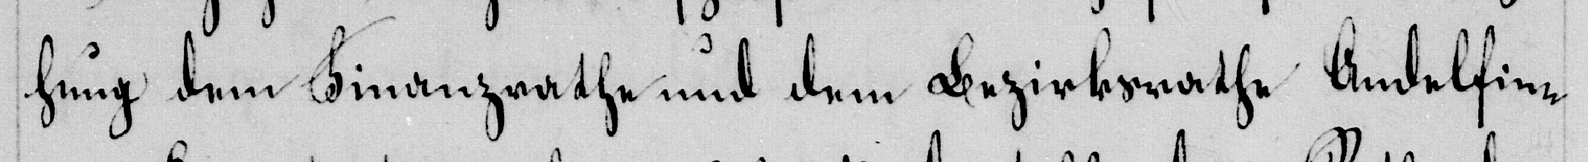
hung dem Finanzrathe und dem Bezirksrathe Andelfin¬
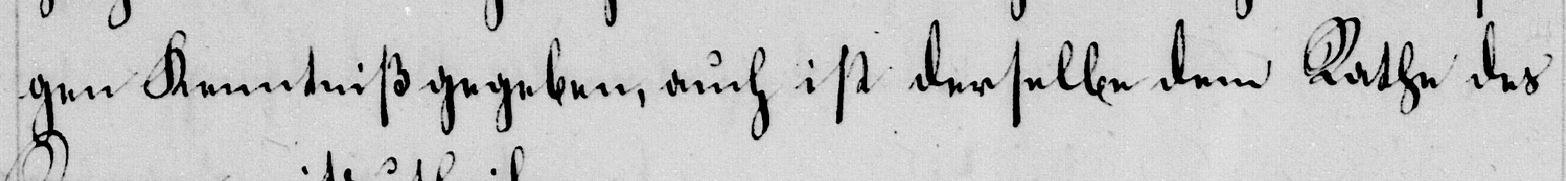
gen Kenntniß gegeben, auch ist derselbe dem Rathe des
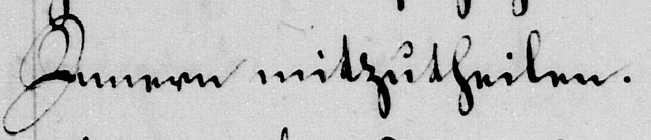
Innern mitzutheilen.
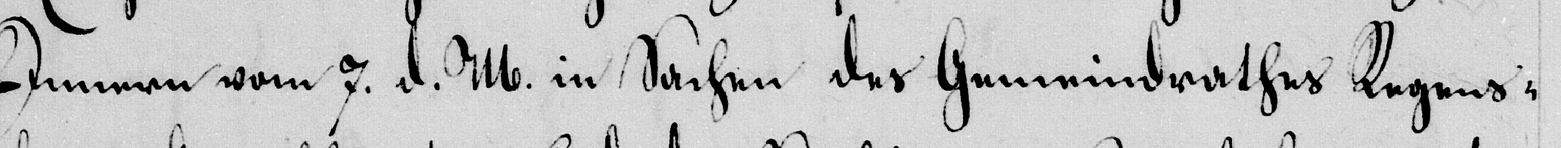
Innern vom 7. d. M. in Sachen des Gemeindrathes Regens¬
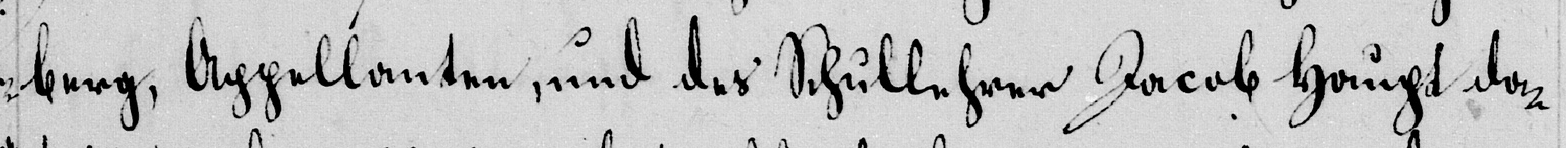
berg, Appellanten, und des Schullehrer Jacob Haupt das¬
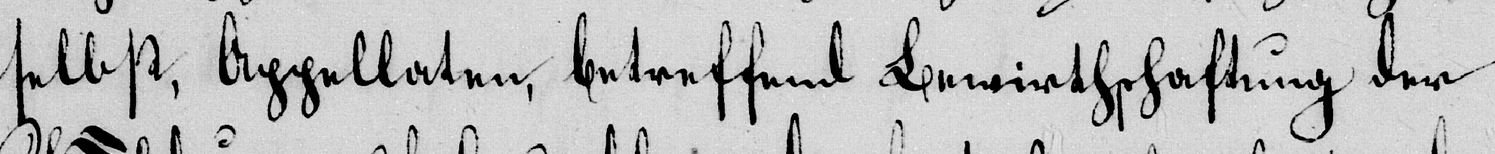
elbst, Appellaten, betreffend Bewirthschaftung der
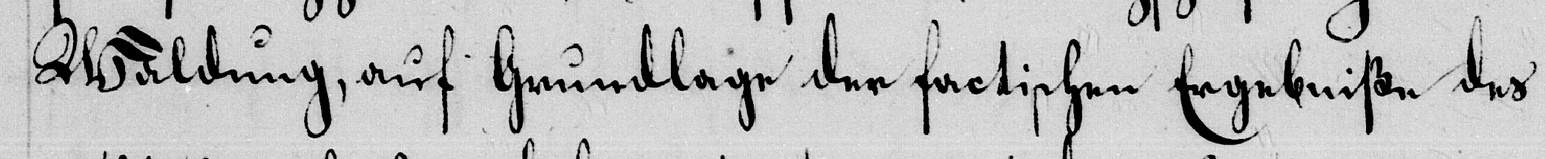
Waldung, auf Grundlage der factischen Ergebniße des
